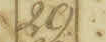29
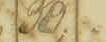39
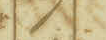1
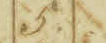5
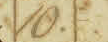10
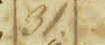31
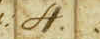4
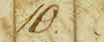10
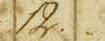12
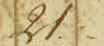21
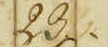23
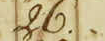26
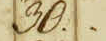30
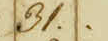31
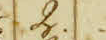2
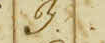3
